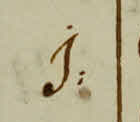1:
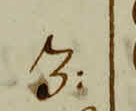3:
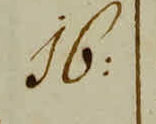16:
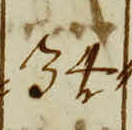34
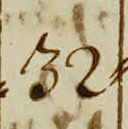32
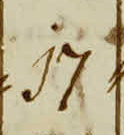17
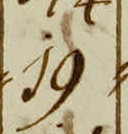19
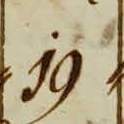19
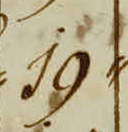19
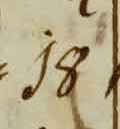18
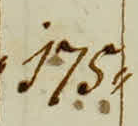175
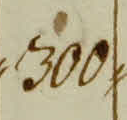300
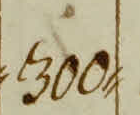300
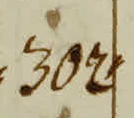302
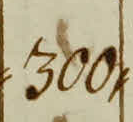300
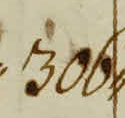306
